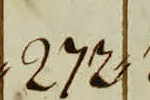272
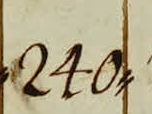240
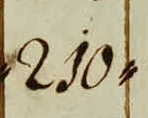210
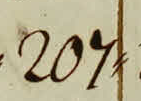207
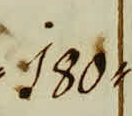180
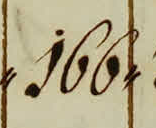166
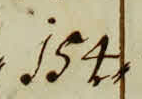154
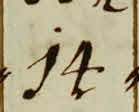14
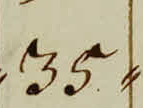35
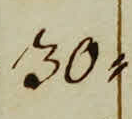30
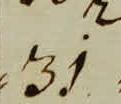31
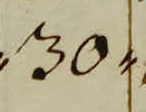30
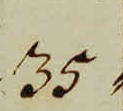35
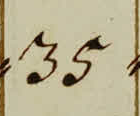35
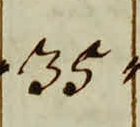35
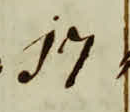17
